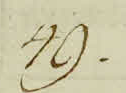49
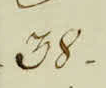38
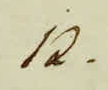12
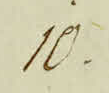10
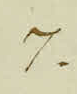7
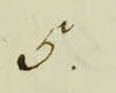5.
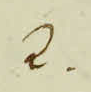2
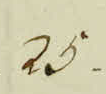25
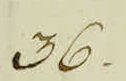36
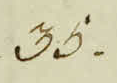35
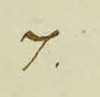7.
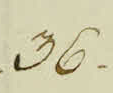36
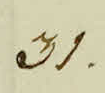31
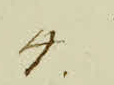4.
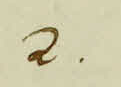2.
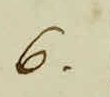6.
